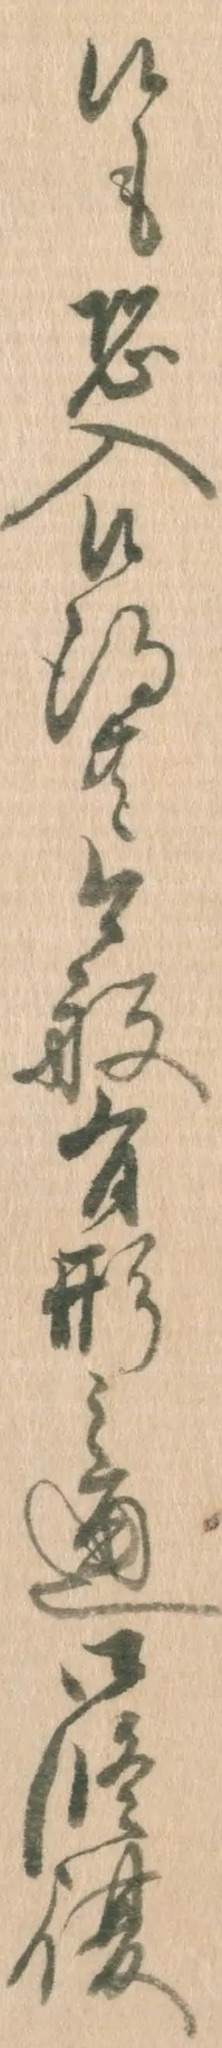候も恐入候得共今般有形之通御修復
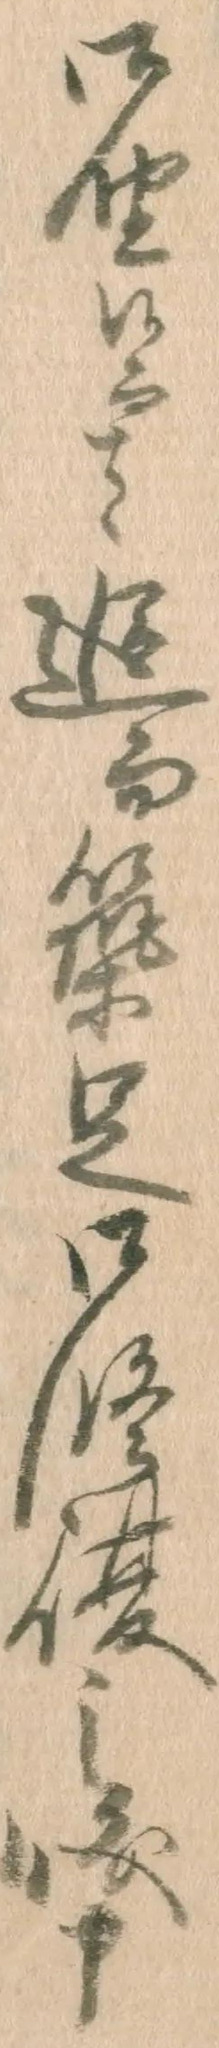御届候ては追て築足御修復之儀申
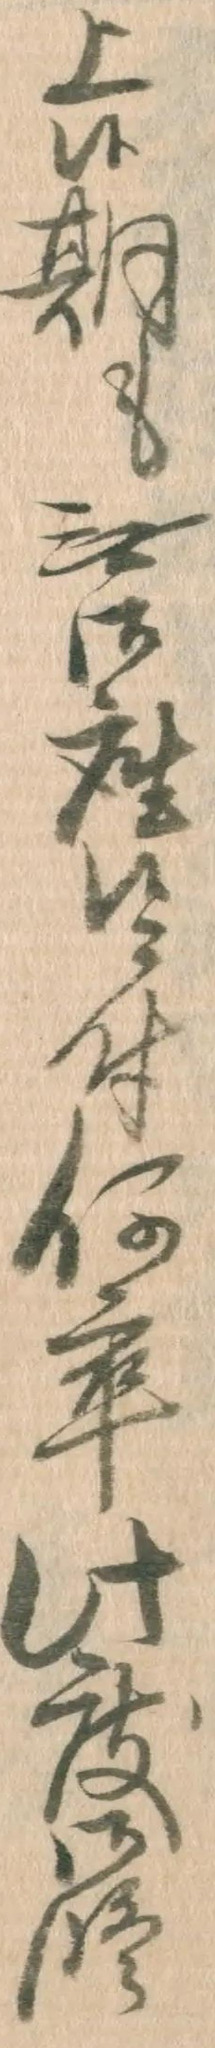上候期も無御座候ニ付何卒此度御修
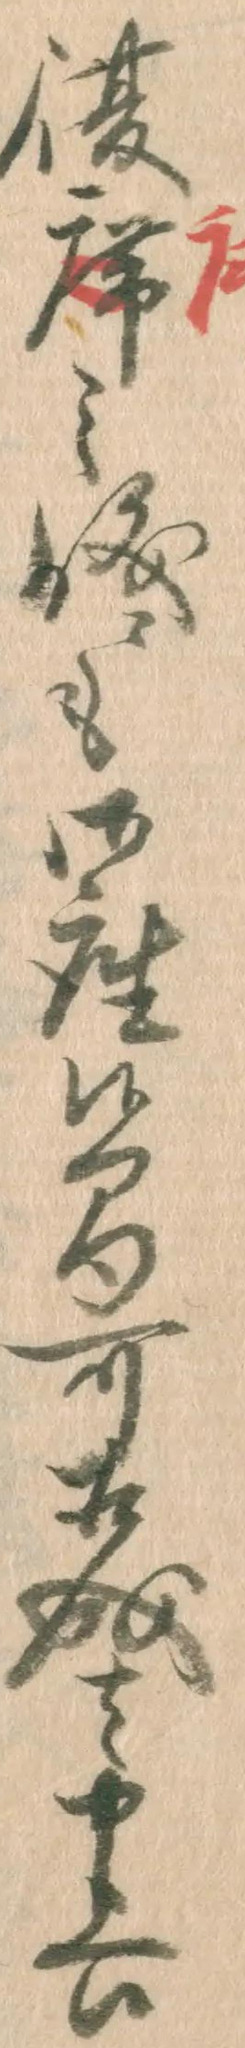復序之儀ニも御座候間可相成は申上候
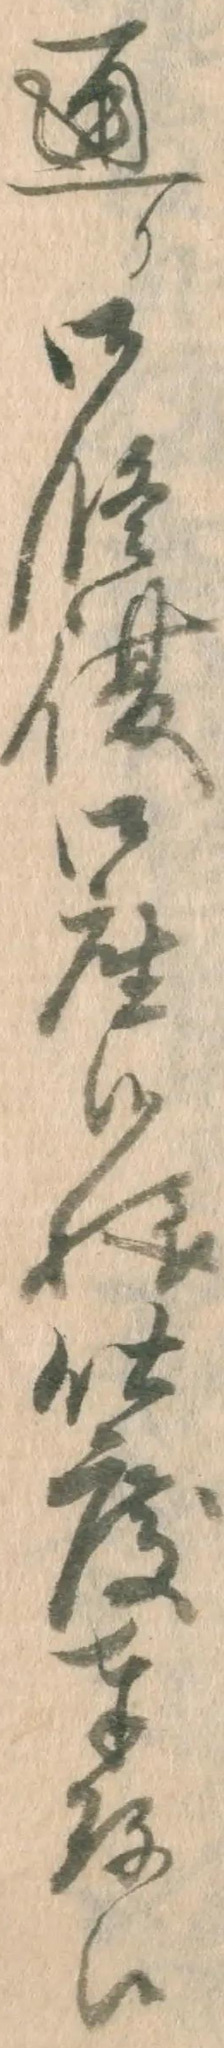通り御修復御座候様仕度奉存候
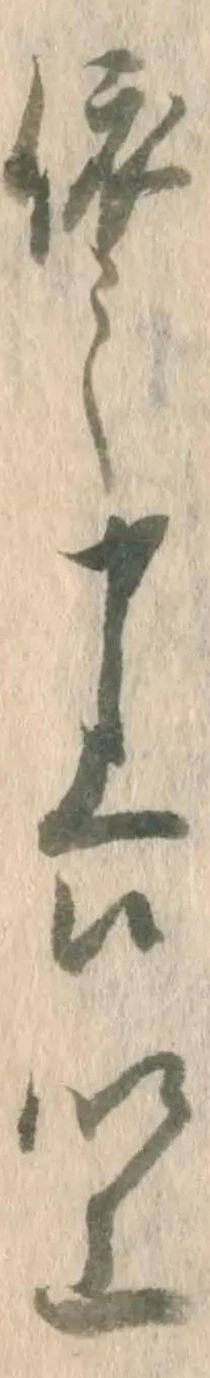依之申上候以上

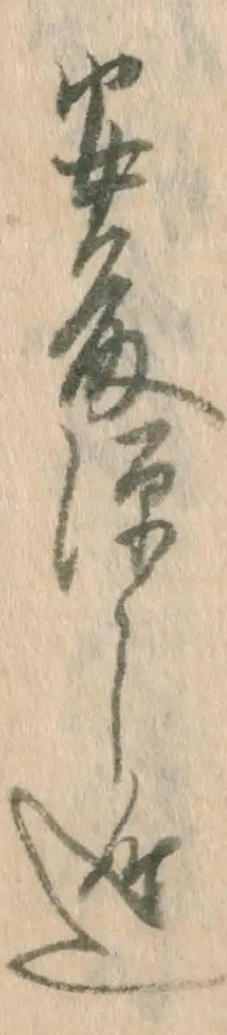安藤源之進
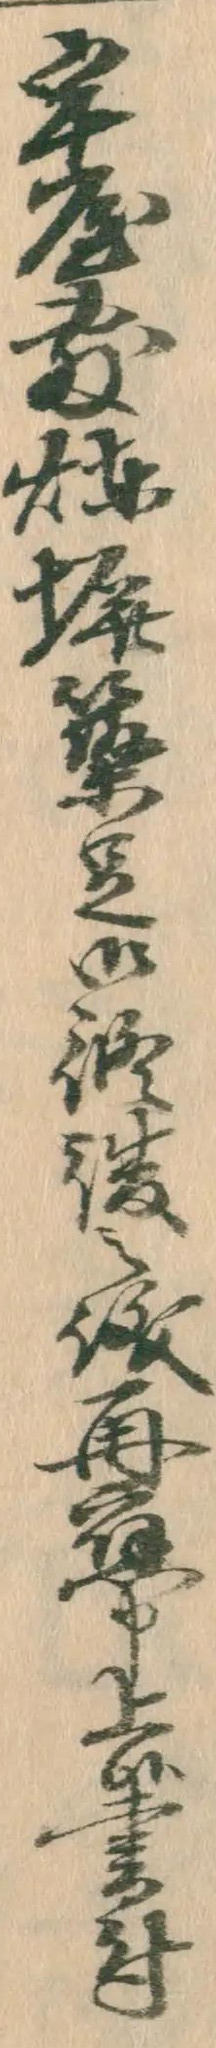│牢屋敷煉塀築足御修復之儀再応申上候書付
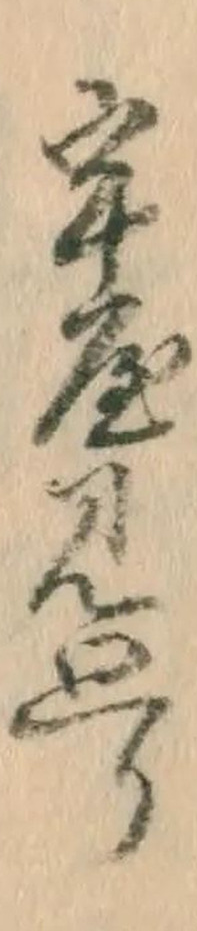│牢屋見廻り
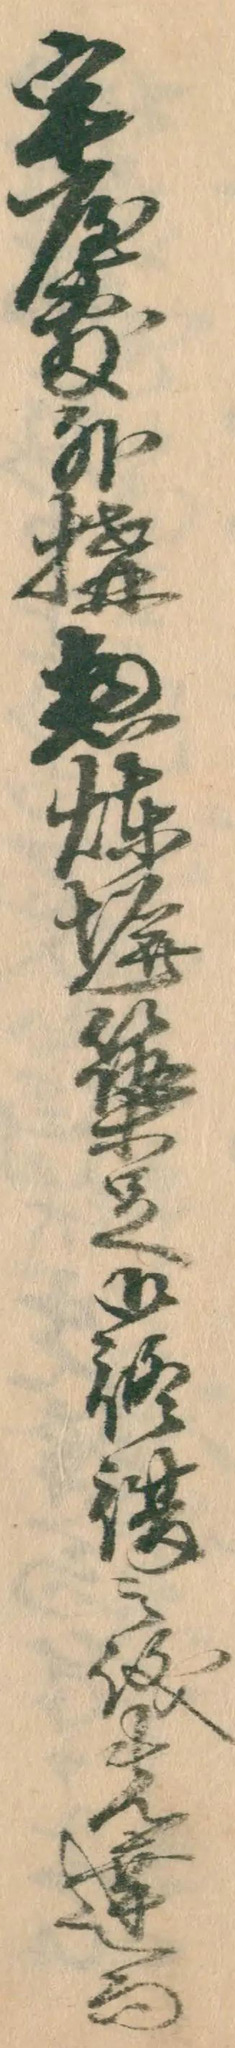牢屋敷外構惣煉塀築足御修復之儀先達て
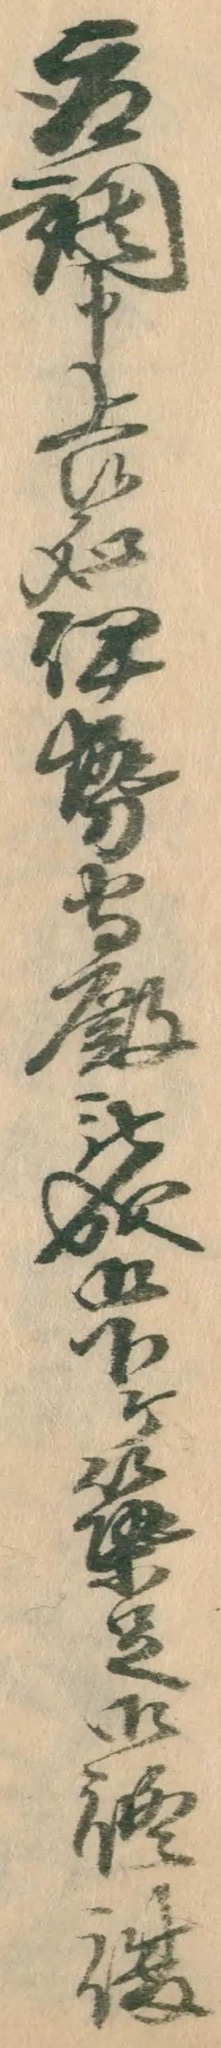取調申上候処伊勢守被成御下ケ築足御修復

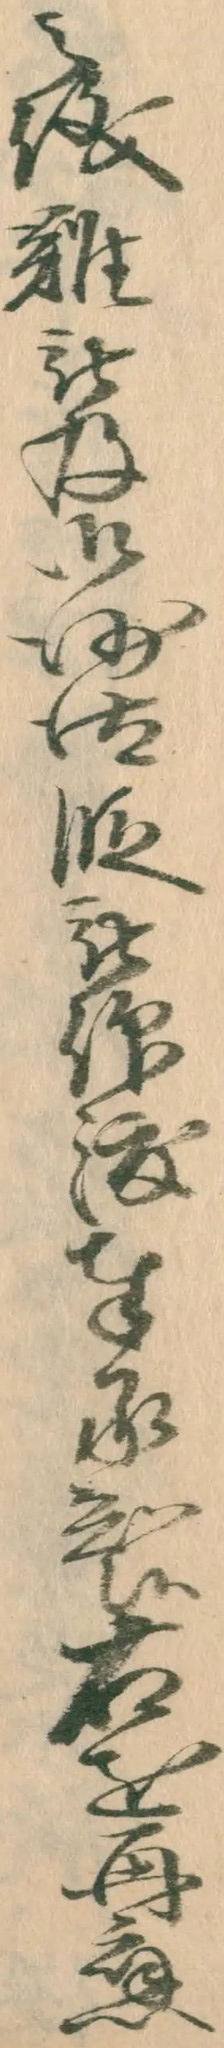之儀難被及御沙汰段被仰渡奉承知候右を再応
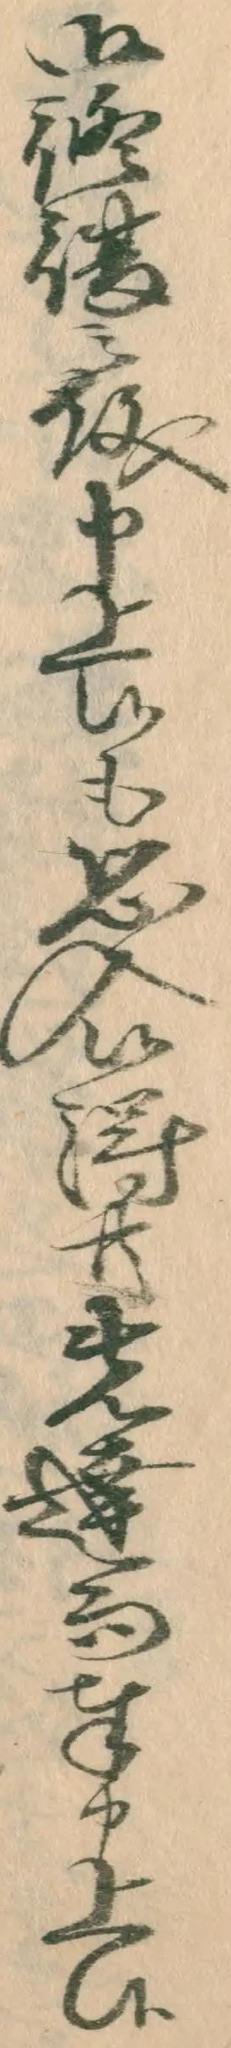御修復之儀申上候も恐入候得共先達て奉申上候
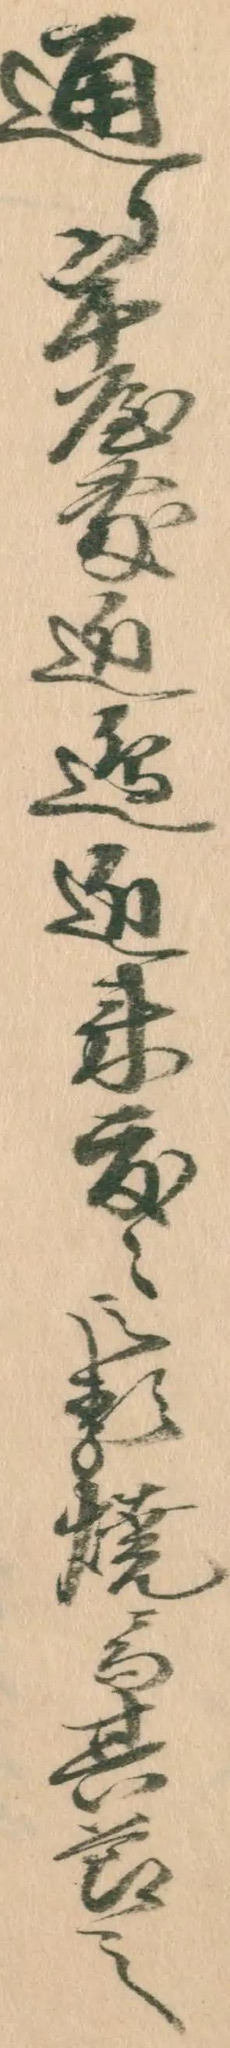通り牢屋敷近辺近来度〻之類焼ニて其節之
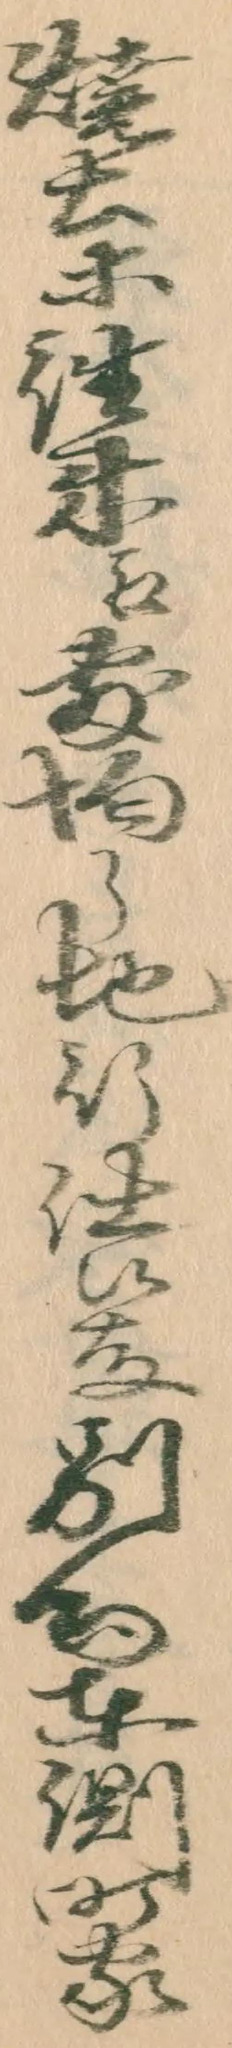焼土等往来え敷均し地行仕候故別て東側町家
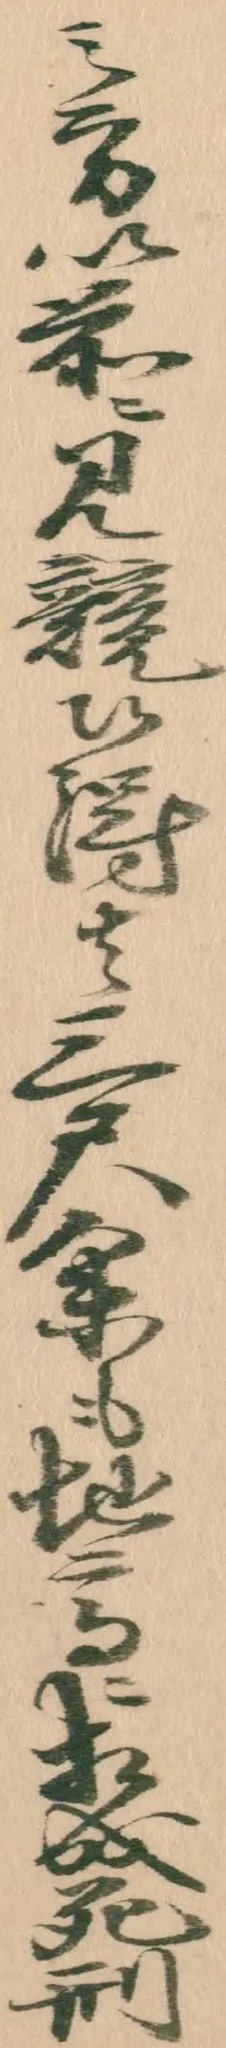之方以前ニ見競候得は三尺余も地高ニ相成死刑
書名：七十冊物類集 71巻. [44] 四十三 牢屋敷御普請御修覆地震ニ付骨折候牢屋掛御褒美之部
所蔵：国立国会図書館 National Diet Library, JAPAN
